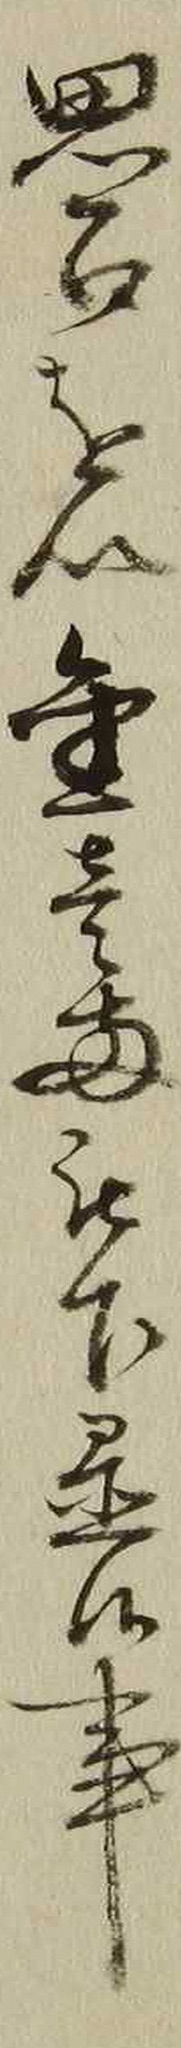思召を以金壱両被下置候事
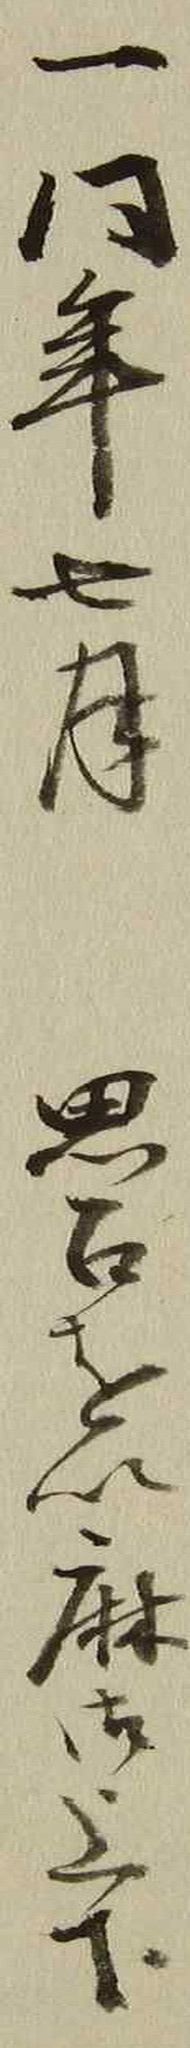一同年七月思召を以麻御上下
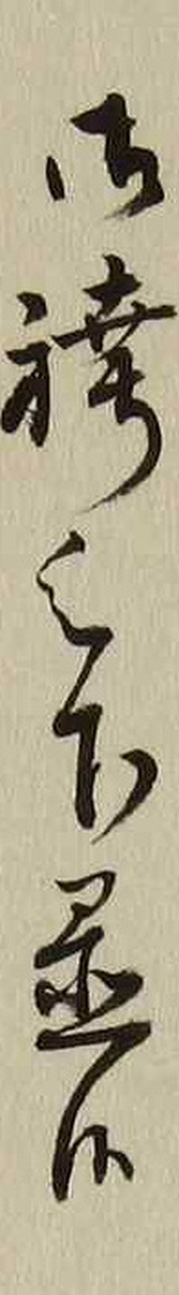御袴被下置候
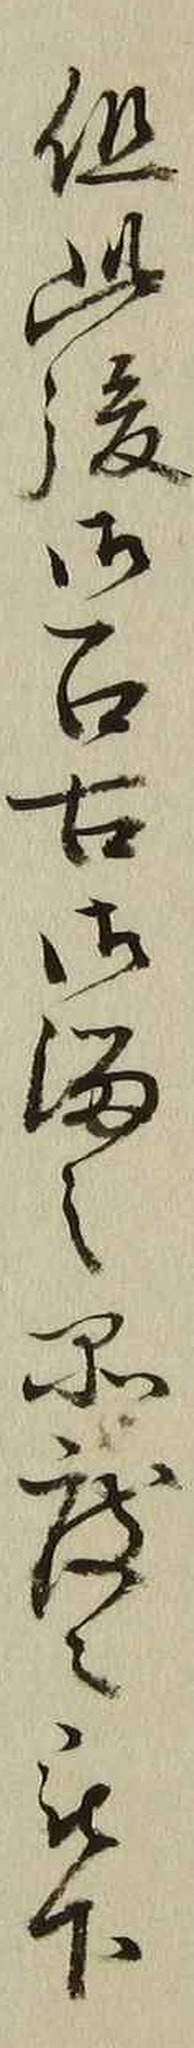但此後御召古御溜之品度々被下
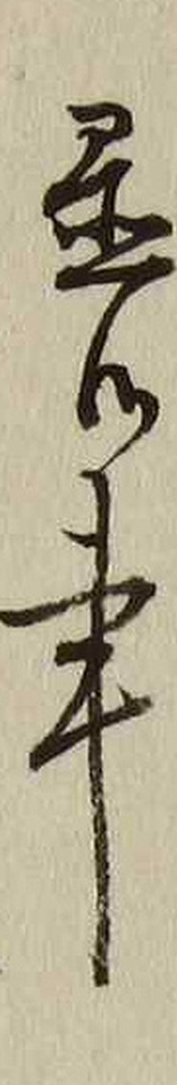置候事
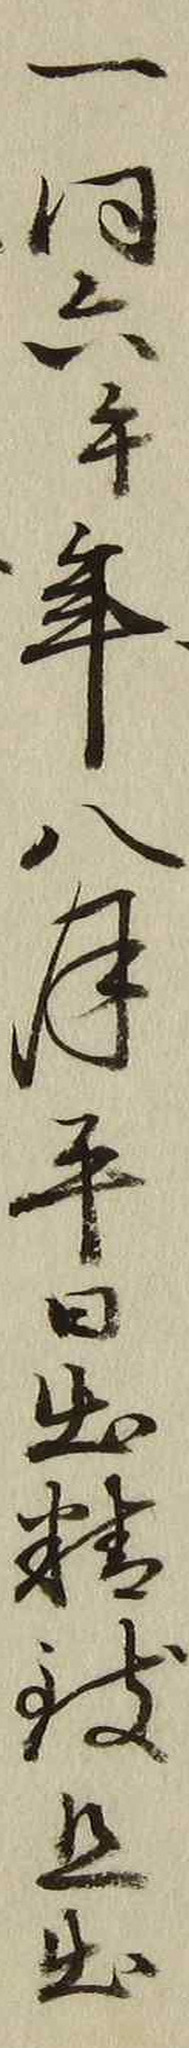一同六午年八月平日出精致且出
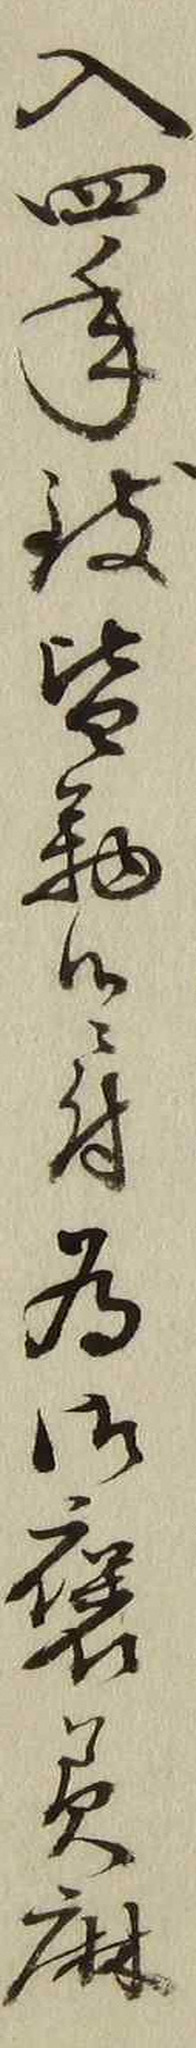入四年致皆勤候ニ付為御褒美麻
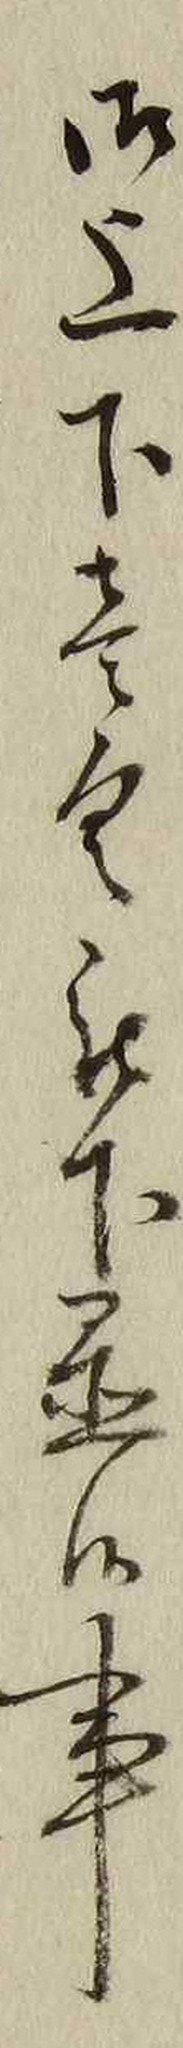御上下壱具被下置候事
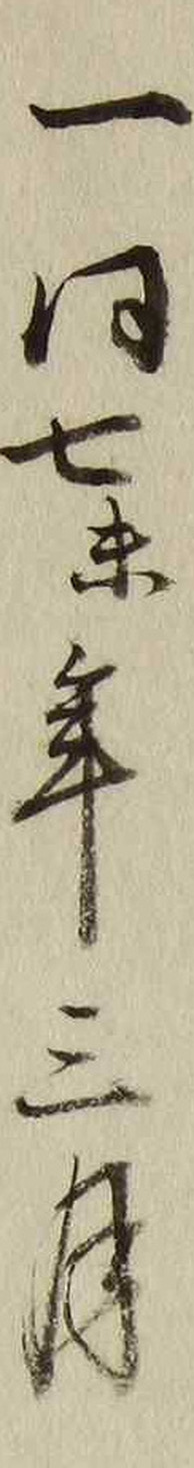一同七未年三月
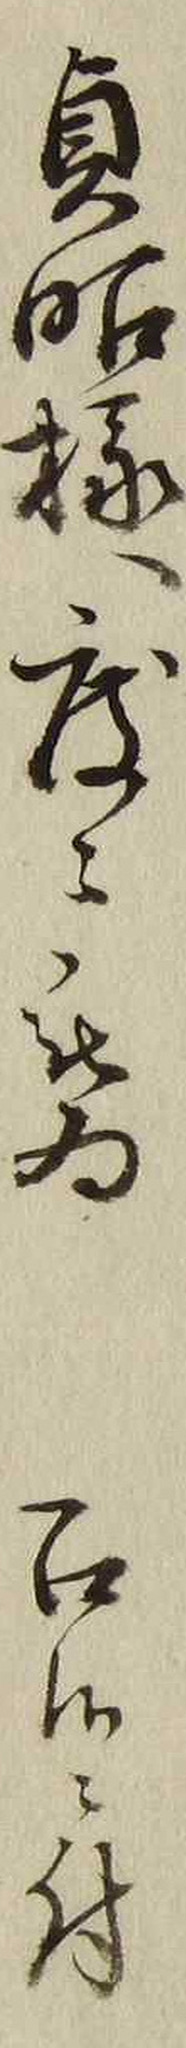貞昭様へ度々被為召候ニ付
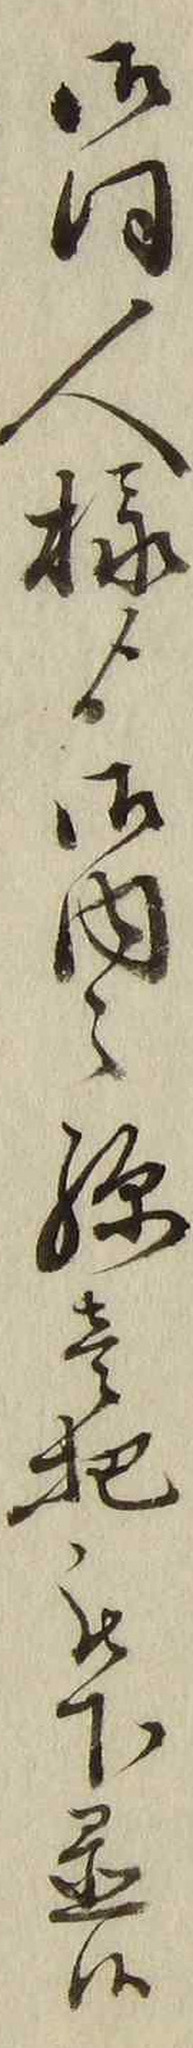御同人様ゟ御内々綿壱把被下置候

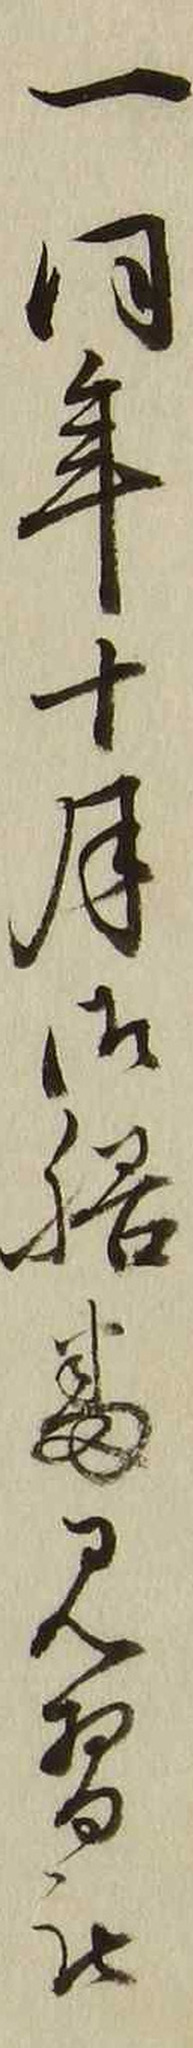一同年十月御膳番見習被
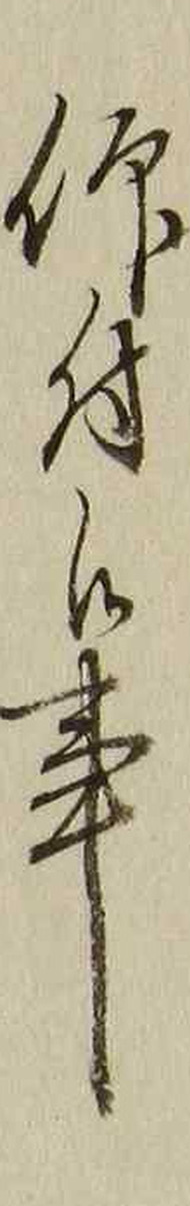仰付候事
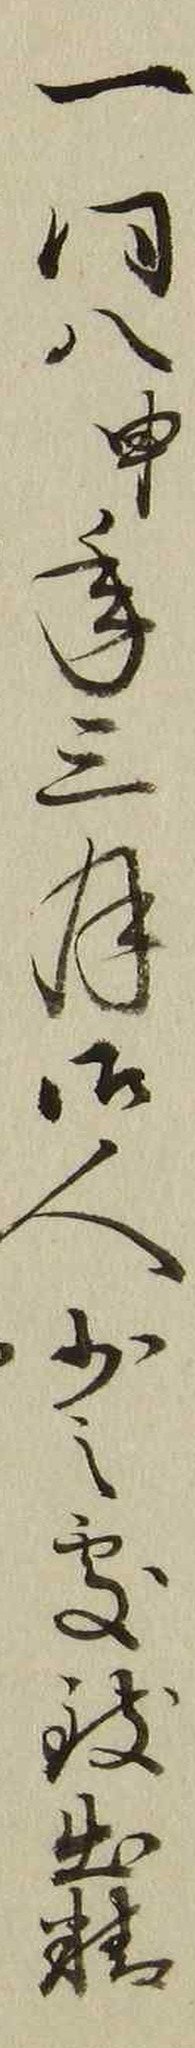一同八申年三月御人少之処致出精
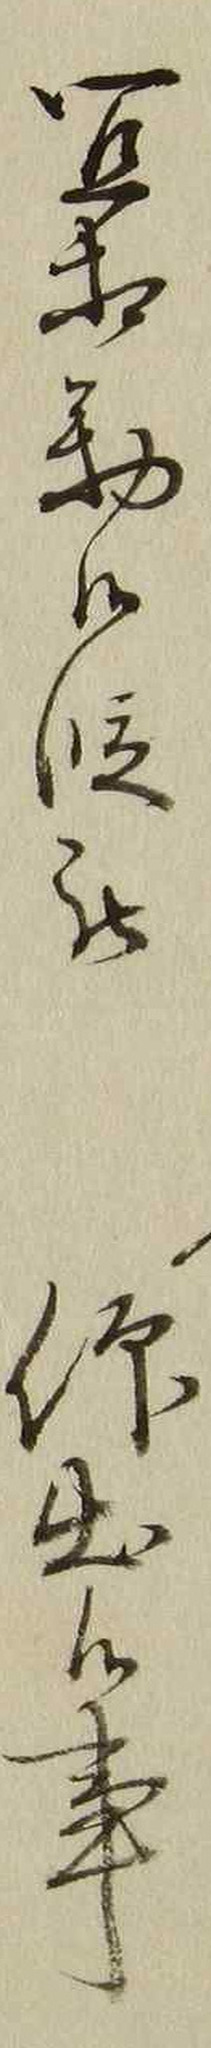宜相勤候段被仰出候事
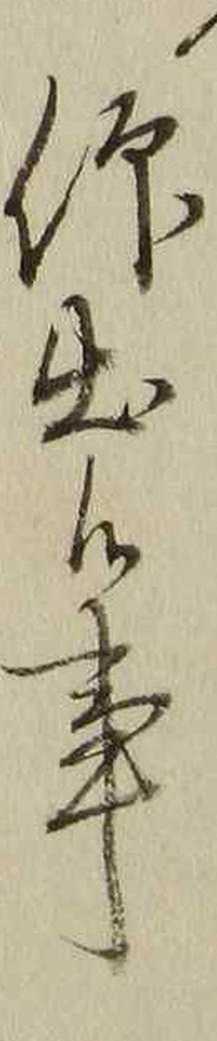仰付候事
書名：諸士系譜　巻之35　は之部3
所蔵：会津若松市立会津図書館
